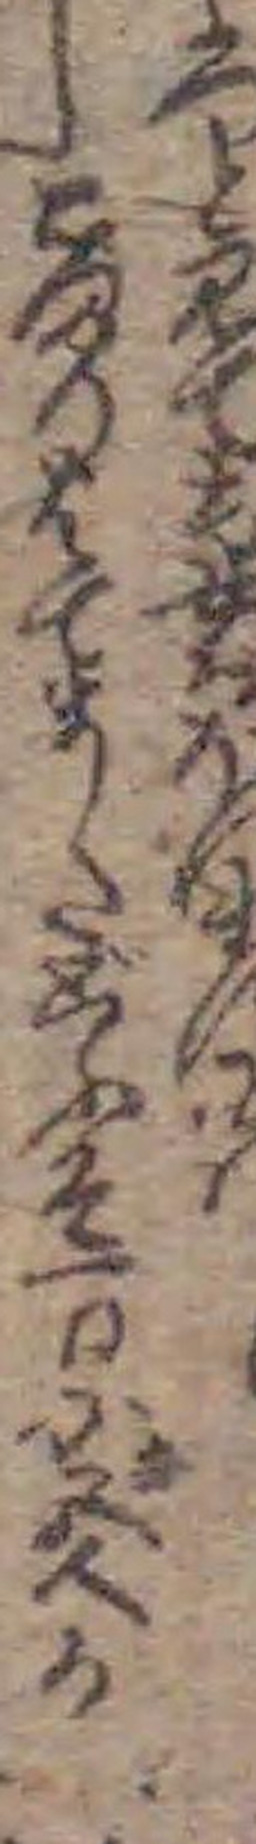こまりはてましたどふそ一日に五人か
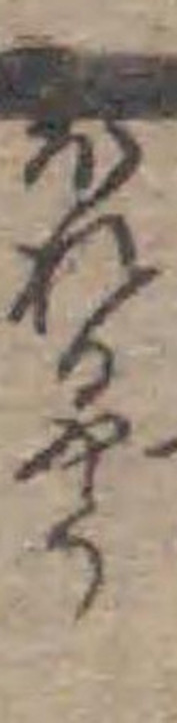ほれるやう
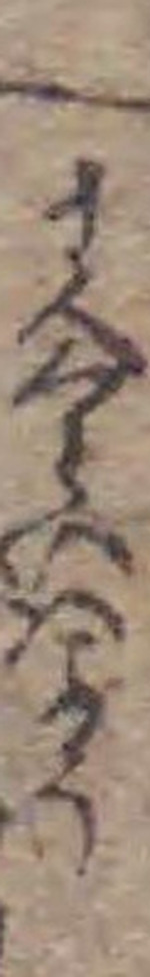十人くらいはよう
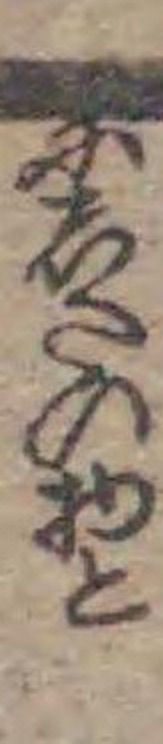にしたい物と
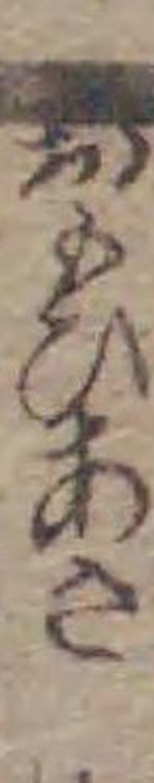おもひあさ
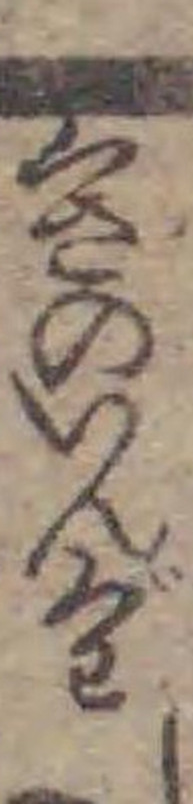くさのいんぐわ
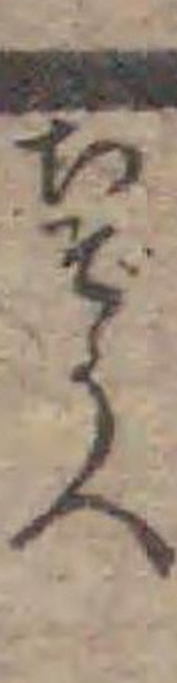ちぞうへ
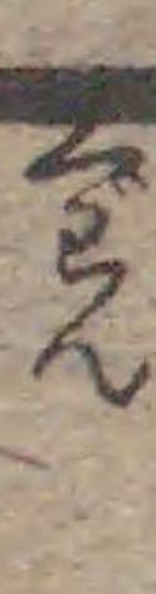ぐわん
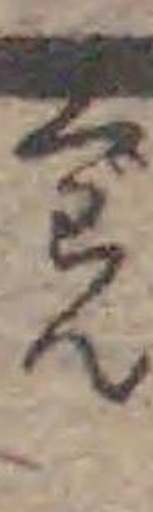ぐわん
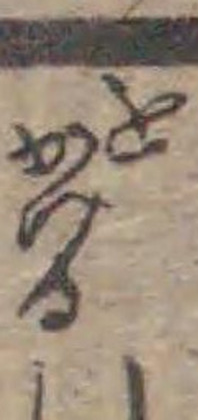かける

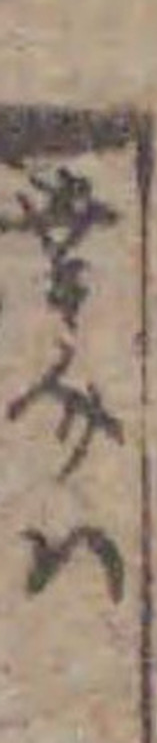幸介は
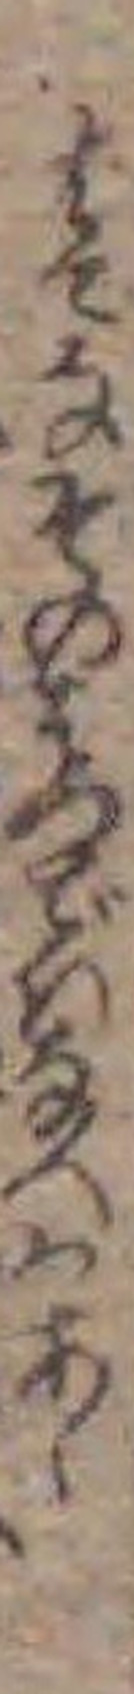はてなそのはづではないにあゝ
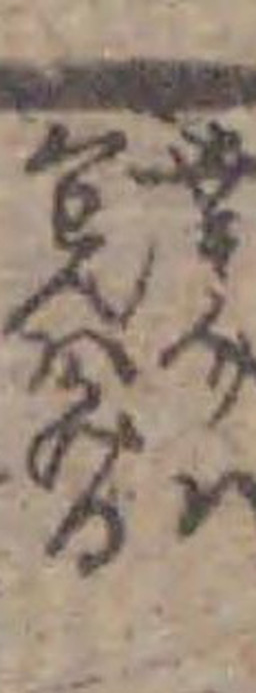くわんはみる
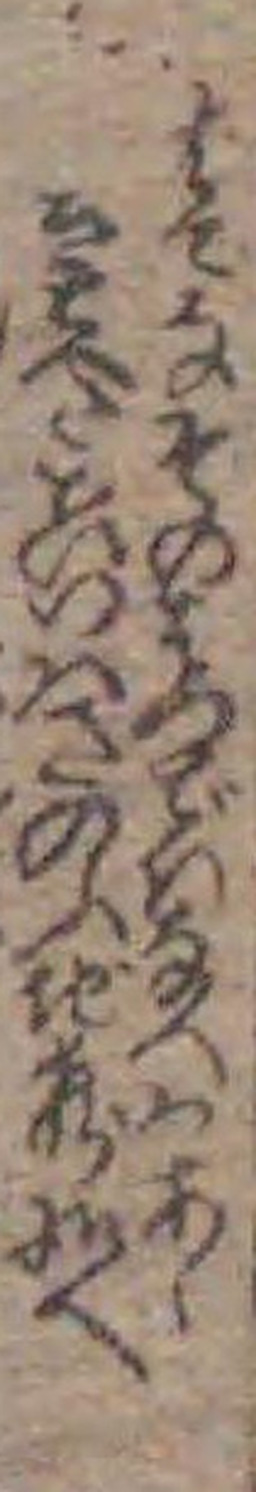おもへたしいはきのふ地蔵処へ
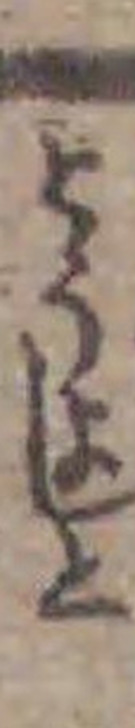とそよしと
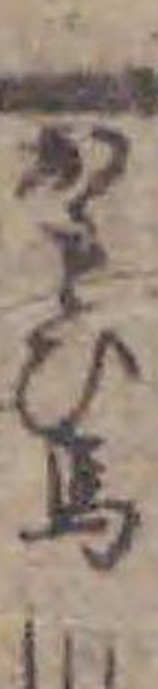おもひ馬
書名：通風伊勢物語 : 3巻
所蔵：国立国会図書館 National Diet Library, JAPAN
